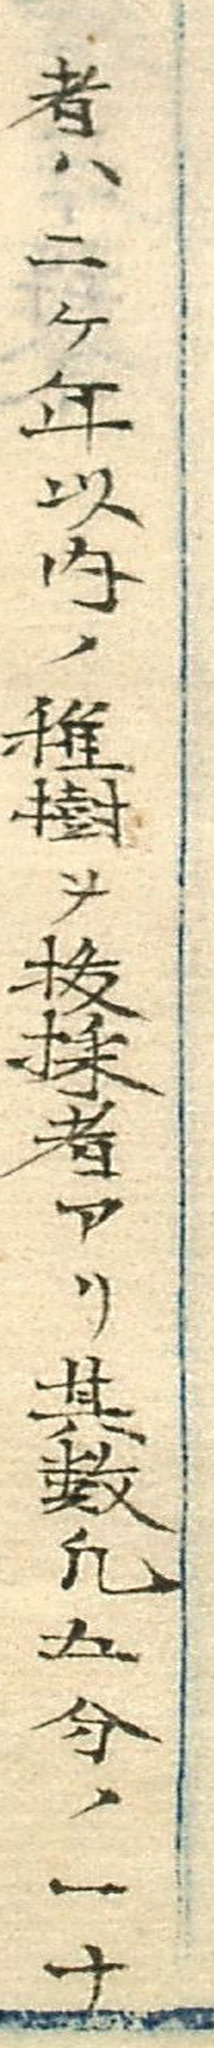者ハ二ヶ年以内ノ稚樹ヲ抜採者アリ其数凡五分ノ一ナ
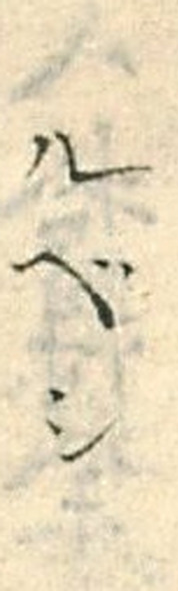ルベシ
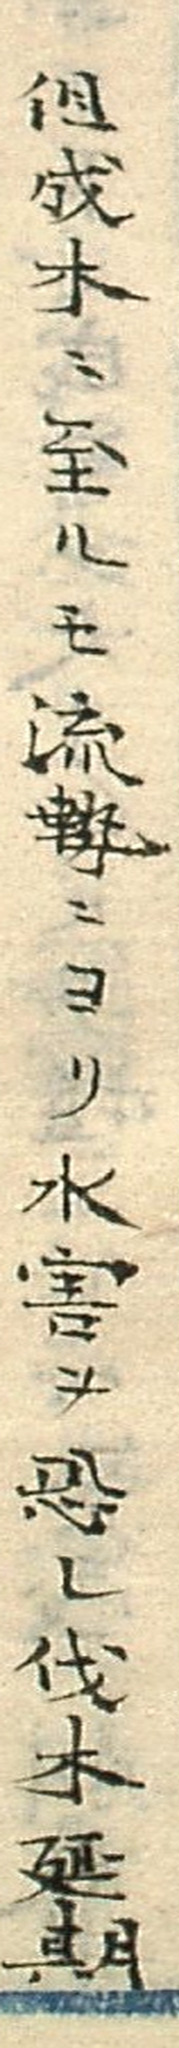但成木ニ至ルモ流勢ニヨリ水害ヲ恐レ伐木延期
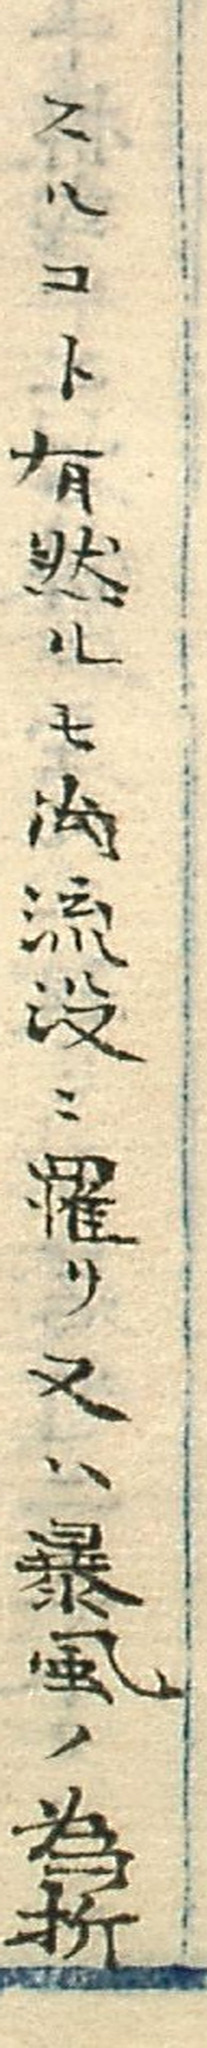スルコト有然ルモ尚流没ニ罹リ又ハ暴風ノ為折
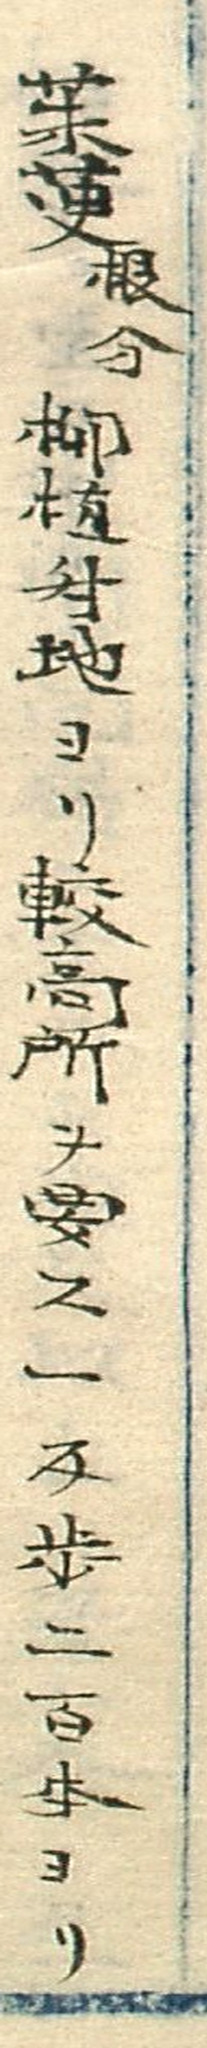茱萸根分柳植付地ヨリ較高所ヲ要ス一反歩二百本ヨリ
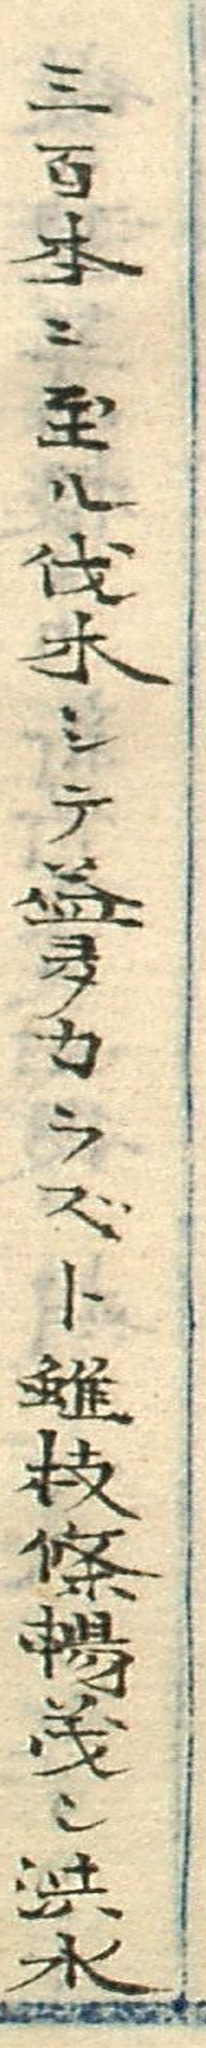三百本ニ至ル伐木シテ益多カラズト雖枝条暢茂シ洪水
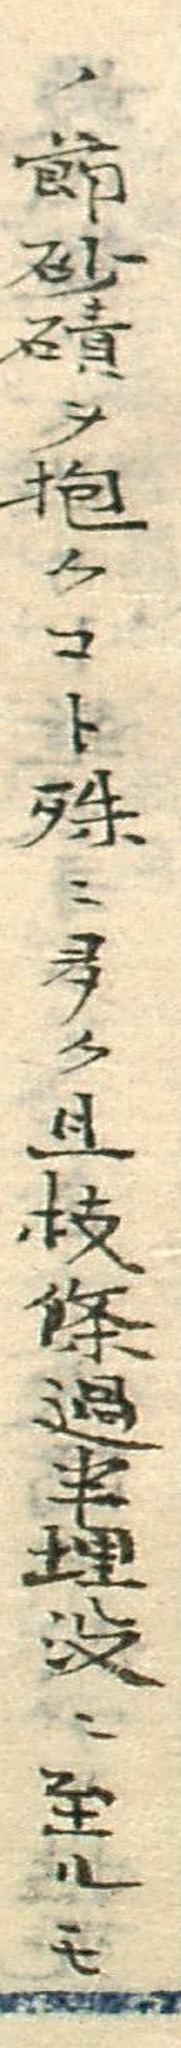ノ節砂磧ヲ抱クコト殊ニ多ク且枝条過半埋没ニ至ルモ
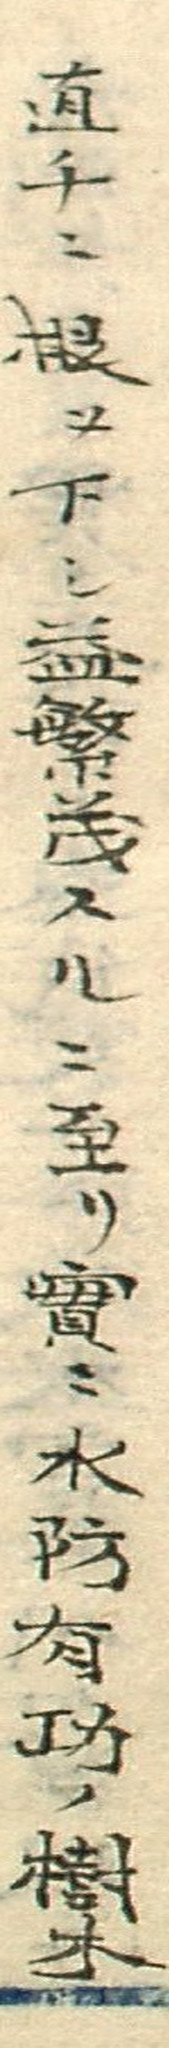直チニ根ヲ下シ益繁茂スルニ至リ実ニ水防有功ノ樹木
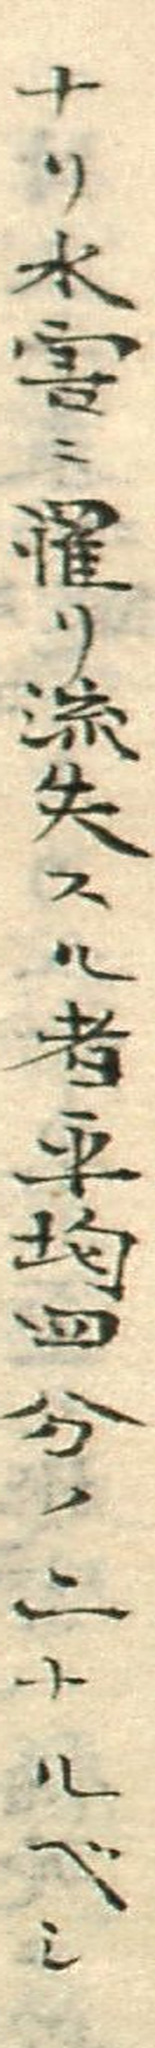ナリ水害ニ罹リ流失スル者平均四分ノ二ナルベシ
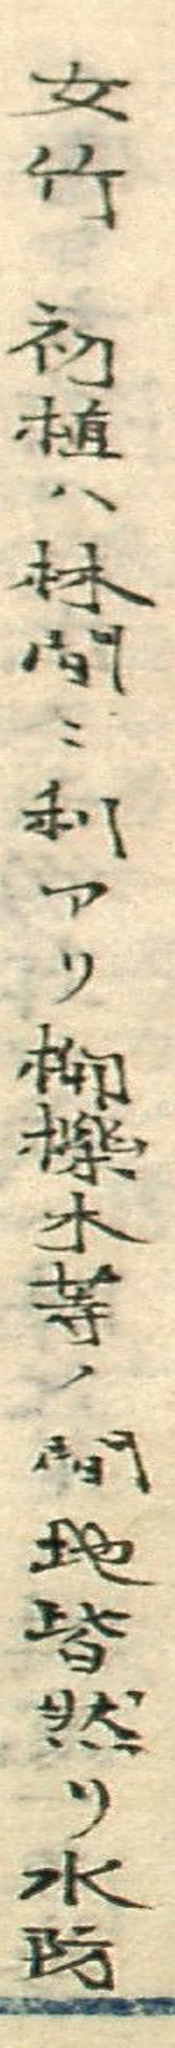女竹初植ハ林間ニ利アリ柳櫟木等ノ間地皆然リ水防
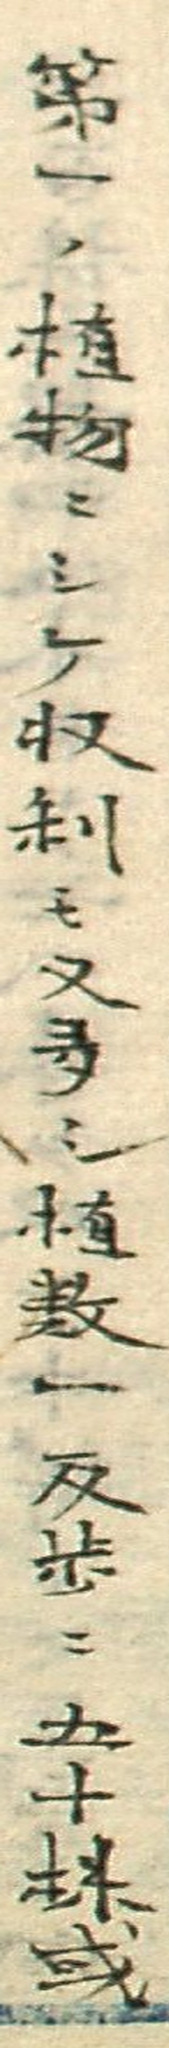第一ノ植物ニシテ収利モ又多シ植数一反歩ニ五十株或

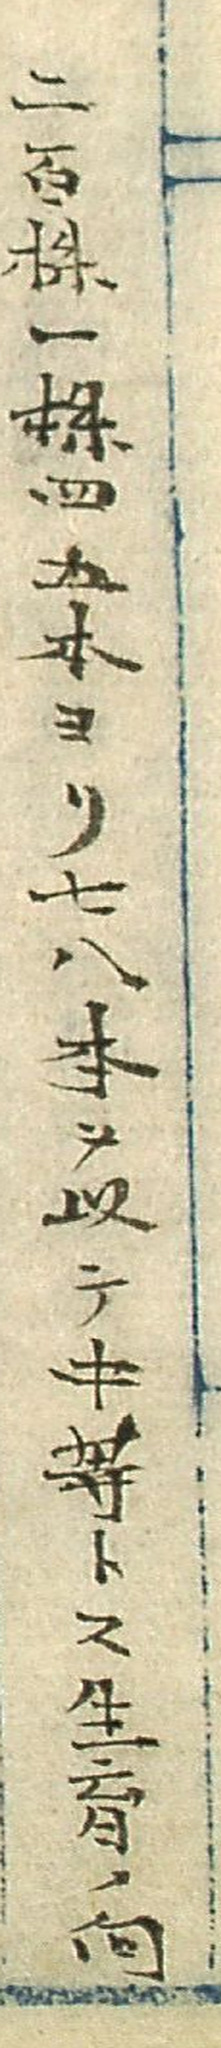二百株一株四五本ヨリ七八本ヲ以テ中等トス生育ノ向
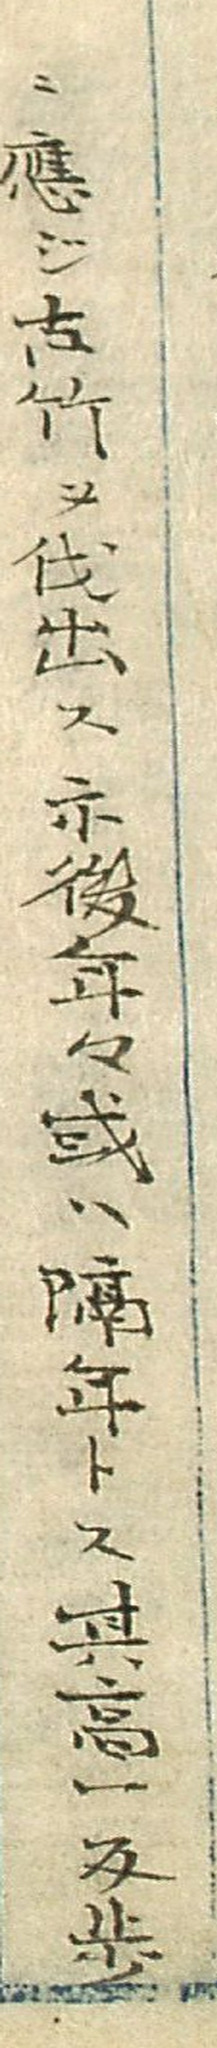ニ応ジ古竹ヲ伐出ス示後年々或ハ隔年トス其高一反歩
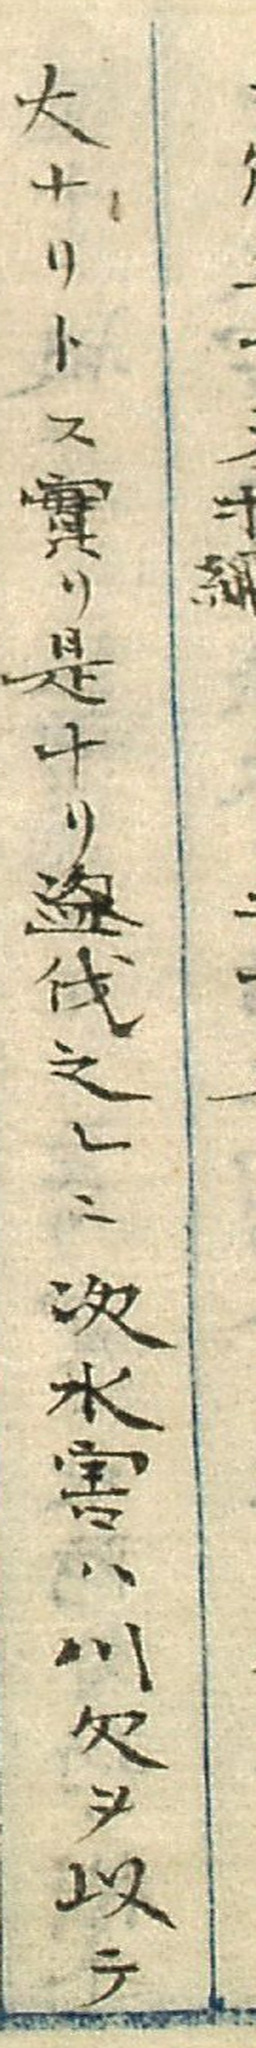大ナリトス実リ是ナリ盗伐之レニ次水害ハ川欠ヲ以テ
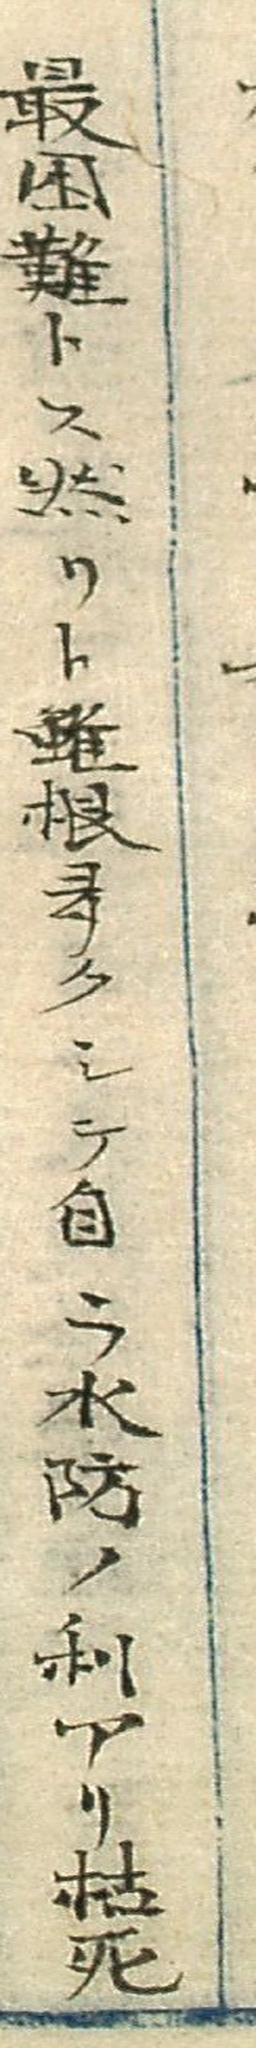最困難トス然リト雖根多クシテ自ラ水防ノ利アリ枯死
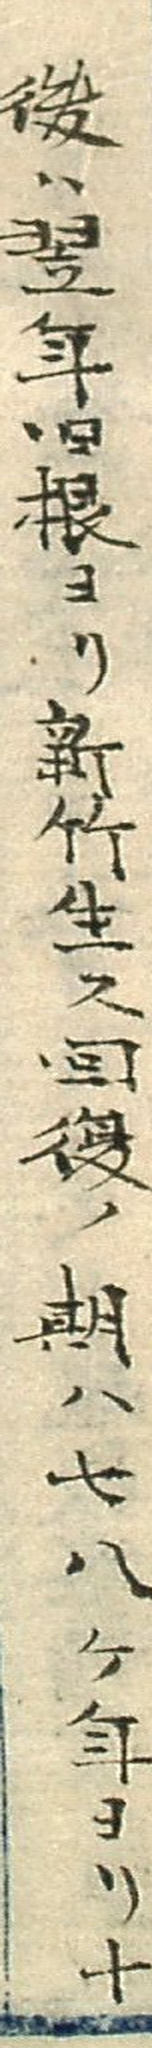後ハ翌年旧根ヨリ新竹生ス回復ノ期ハ七八ヶ年ヨリ十
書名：山林共進会取調書
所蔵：鳴門教育大学 Naruto University of Education
